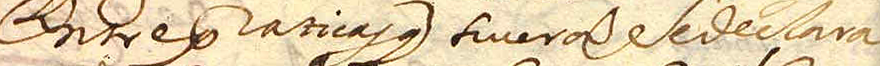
Entre praticas q̄ tiueraõ Se declara
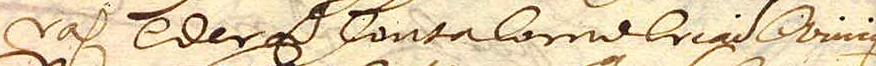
raõ e deraõ Conta Como Criaõ e vivia
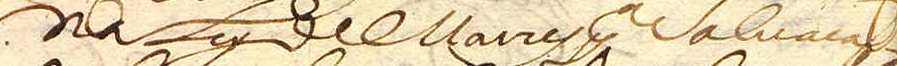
na Ley de Moizes pa Saluacaõ
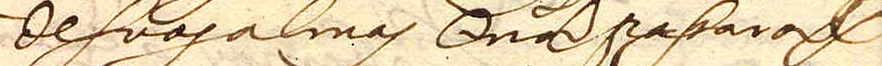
de suas almas E naõ passaraõ
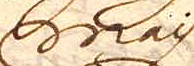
mais
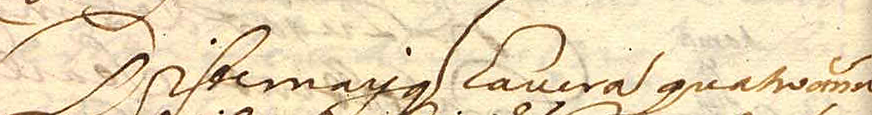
Disse mais q̄ hauera quatro an̄os
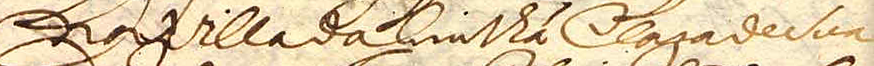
na Villa da Couilhã E Caza de Sua
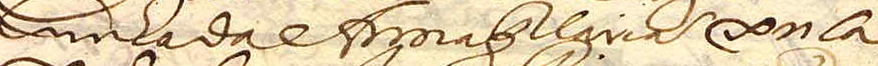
Cunhada Anna Maria xn Ca
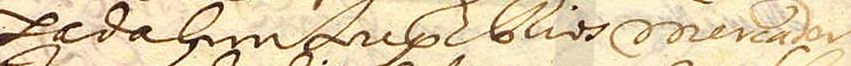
zada Com Jozeph Rios mercador
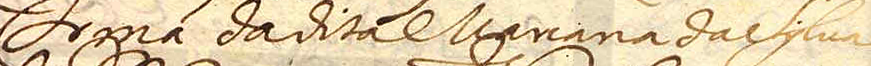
Irmã da dita Mariana da Sylua
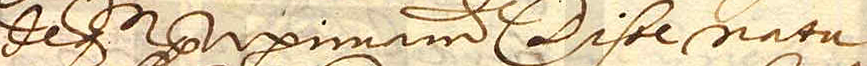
de q.m proximamte Disse natu
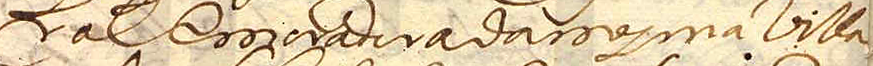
ral E moradora da mesma Villa
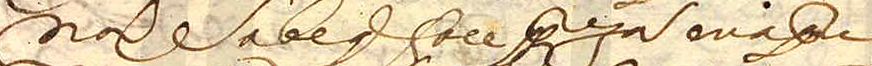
naõ Sabe q̄ foce preza ou apre
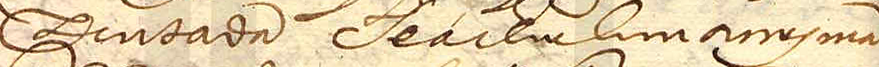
zentada Se achou Com a mesma
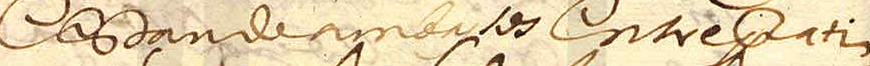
E Estando ambas sos Entre prati
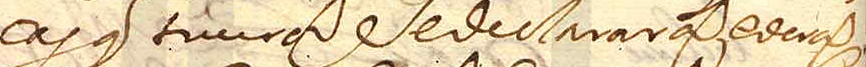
cas q̄ tiueraõ Se declararaõ e deraõ
